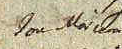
Iose Moreira
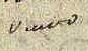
Viuvo
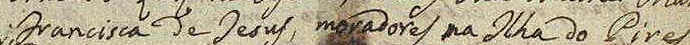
Francisca de Jesus, moradores na Ilha do Pires
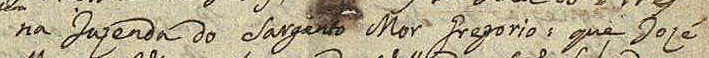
na Fazenda do Sargento Mor Gregorio: que Jozé
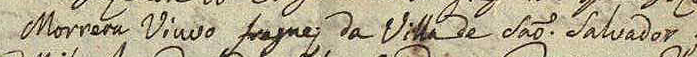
Morrera Viuvo fregues da Villa de Saõ Salvador;
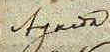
Agueda
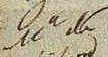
Ma da
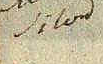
Silva
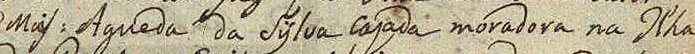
Mais: Agueda da Sylva cazada moradora na Ilha
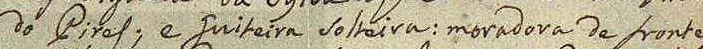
do Pires; e Guiteira solteira: moradora defronte
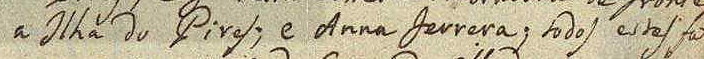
a Ilha do Pires; e Anna Ferrera; todos estas fa
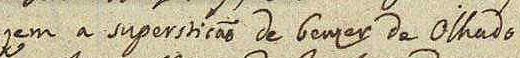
zem a superstiçaõ de benzer de Olhado
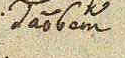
Taõbem
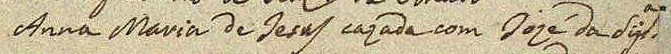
Anna Maria de Iesus cazada com Iozé da Syl.a
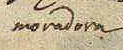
moradora
